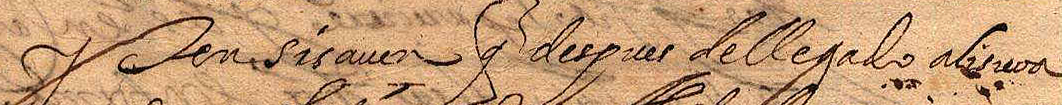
yten si sauen q̄ despues dellegado a lisuoa
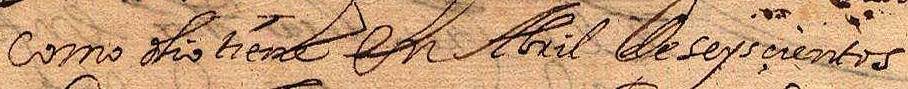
como dho tiene en Abril de seyscientos
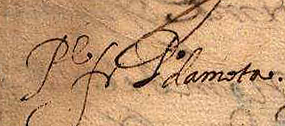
Pe fr Po da mota.
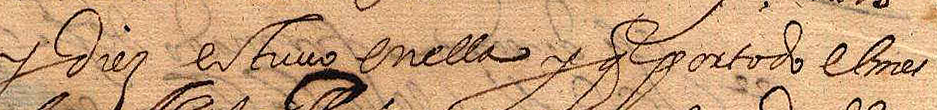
y diez estuuo en ella y q̄ por todo el mes
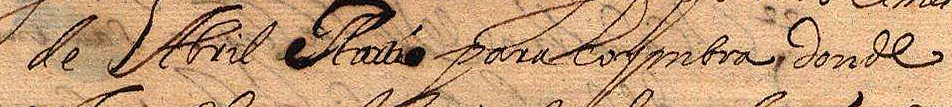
de Abril Partio para coymbra donde
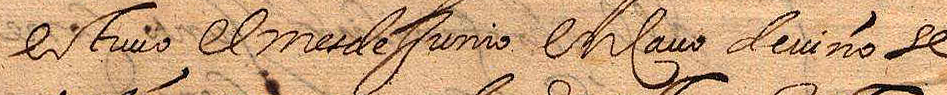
estuuo el mes de Junio en Cauo de uino se
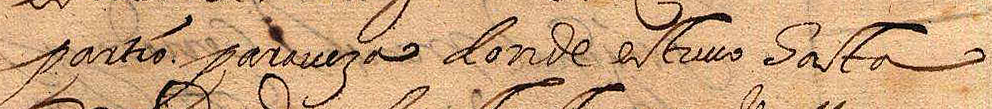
partio para ueza donde estuuo hasta
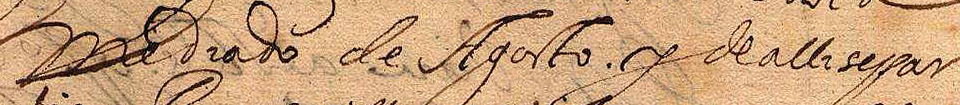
mediado de Agosto. y de alli se par
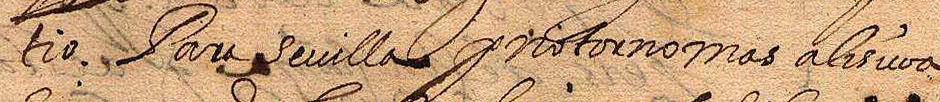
tio. Para seuilla y no torno mas a lisuoa
